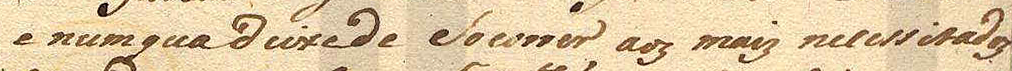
e numqua deixe de socorrer aoz maiz necessitadoz
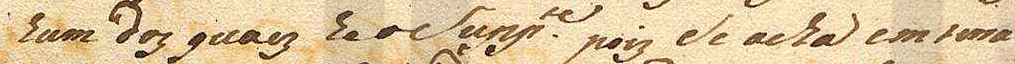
hum doz quaez he o supp.te poiz se acha em terra
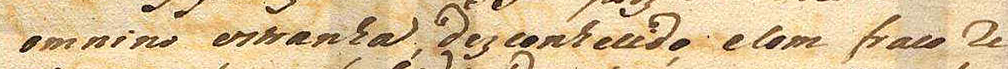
omnino estranha, dezconhecido, e com fraco Re
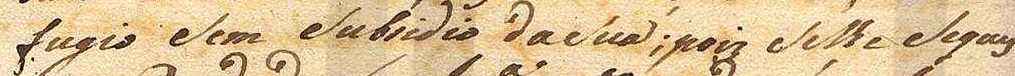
fugio sem subsidio da sua; poiz selhe sequez
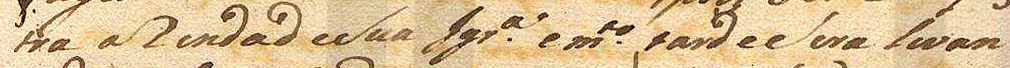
tra aRenda de sua Jgr.a e m.to tarde sera levan
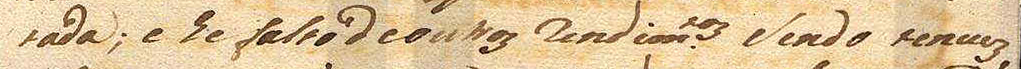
tada; e he falto de outroz Rendim.toz sendo tenuez
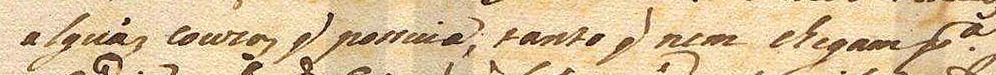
alguāz couzaz q̄ possuia, tanto q̄ nem chegam pa.
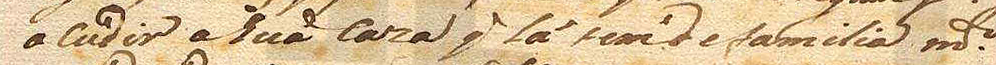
acudir a huā caza q̄ lá tem de familia m.to
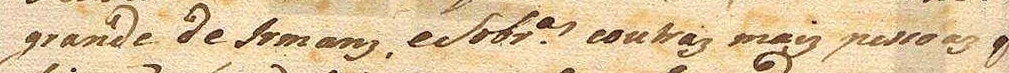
grande de Irmanz, e sobr.as e outraz maiz pessoaz q̄
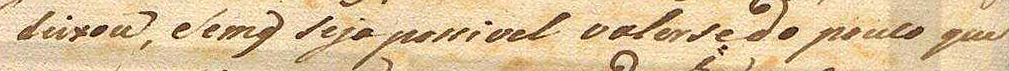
deixou, sem q̄ seja possivel valerse do pouco que
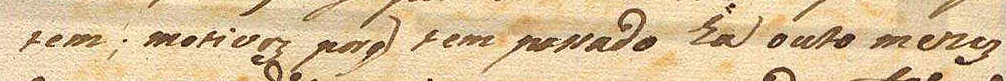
tem; motivoz porq̄ tem passado ha outo mezez
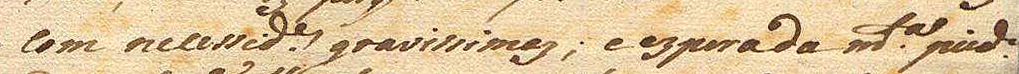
com necessid.ez gravissimaz; e ezpera da m.ta pied.e
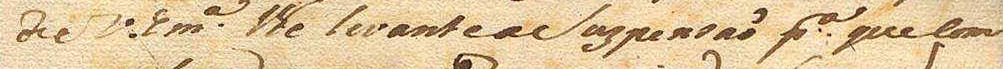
de V. Em.a lhe levante a suzpensaõ p.a que com
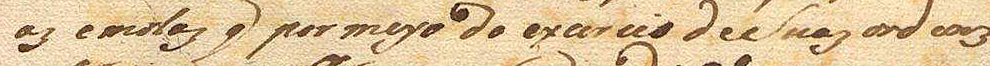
az emolaz q̄ por meyo do excercio de suaz ordenz
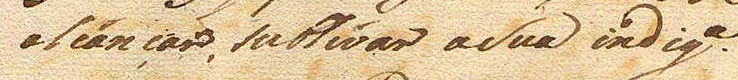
alcançar, sublevar a sua indiga.
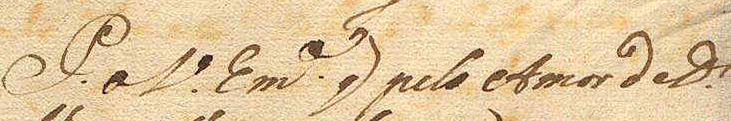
P. a V. Em.a q̄ pelo Amor de D.s
